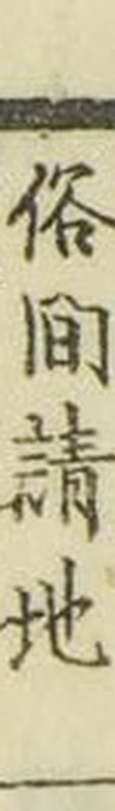俗間請地
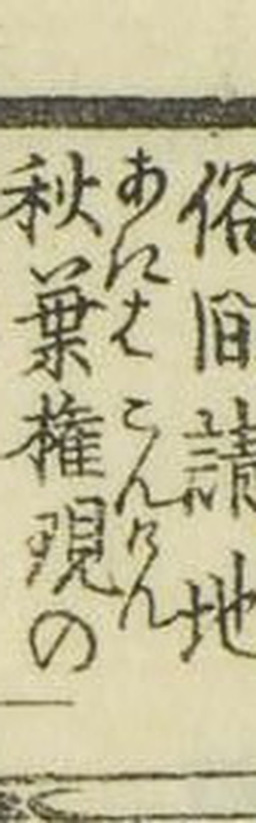秋葉権現の
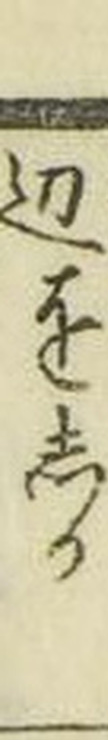辺をしか
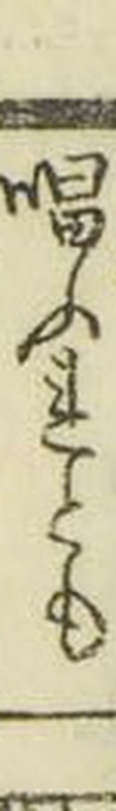唱ふれとも
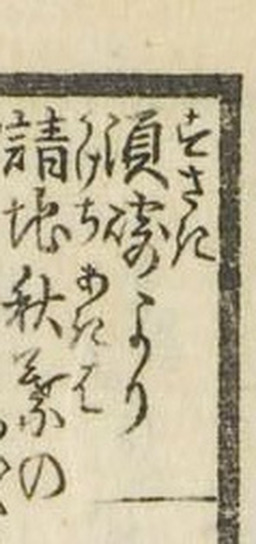須崎より
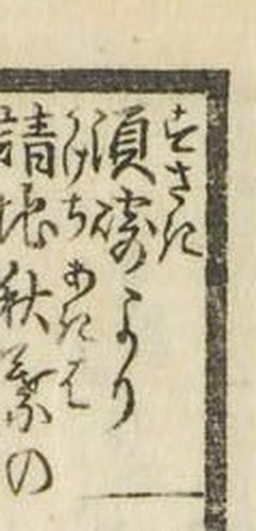須崎より
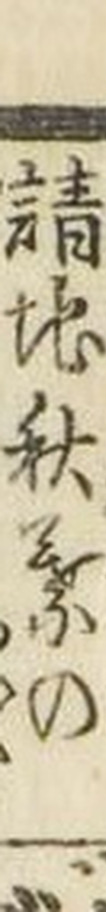請地秋葉の
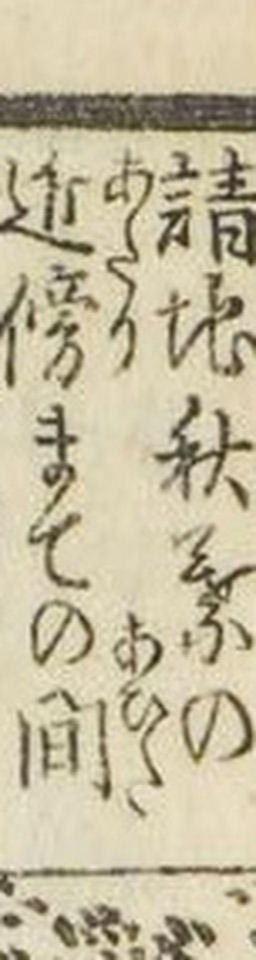近傍まての間
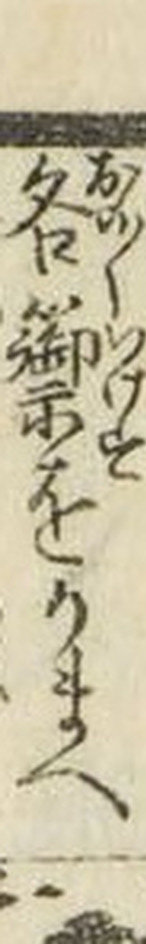各籞をかまへ
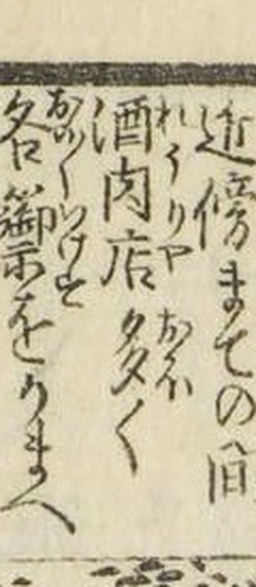酒肉店多く
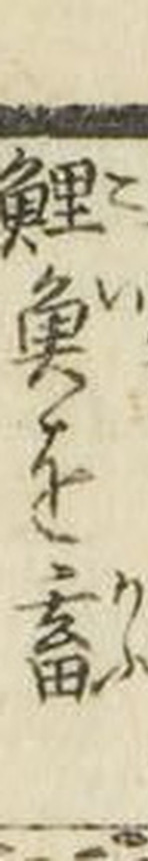鯉魚を畜
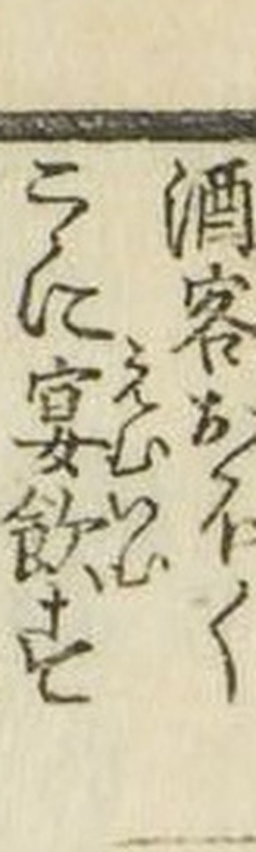こゝに宴飲す
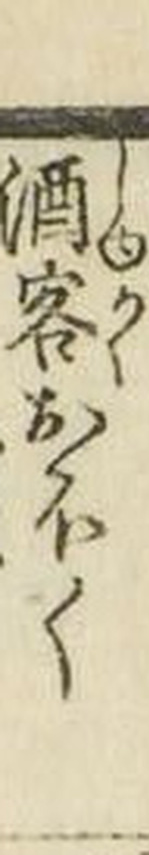酒客おほく
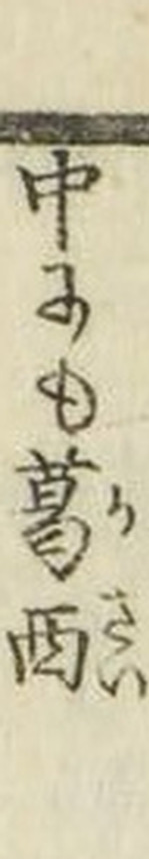中にも葛西
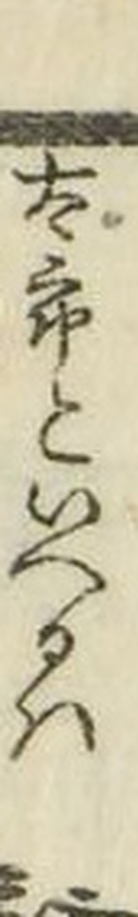太郎といへるは
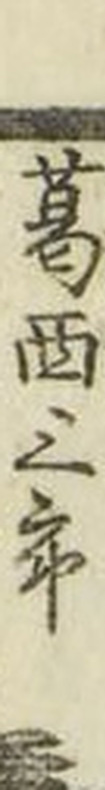葛西三郎
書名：江戸名所図会 20巻 巻之19
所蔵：東京学芸大学教育コンテンツアーカイブ
